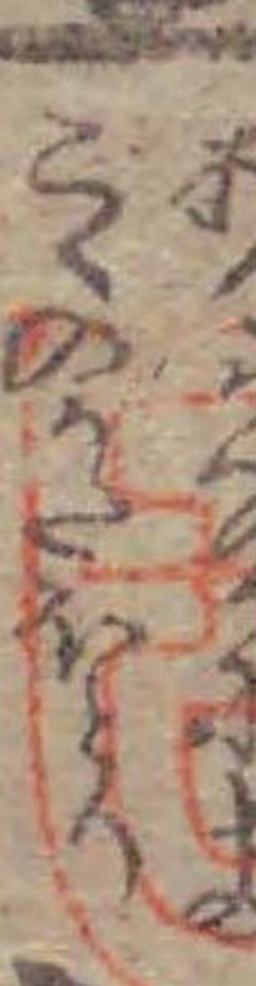こくのかたほとり
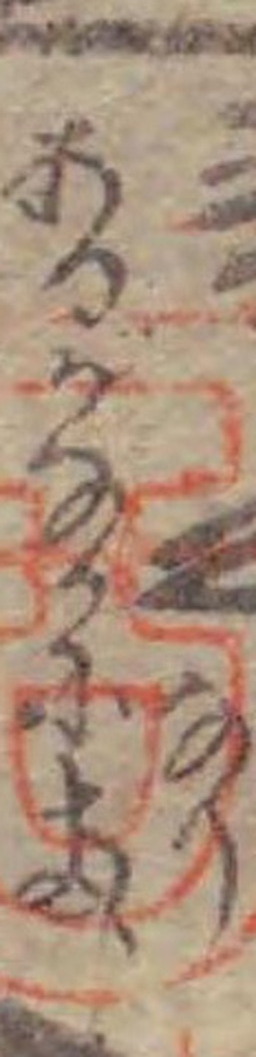あるがなかに両
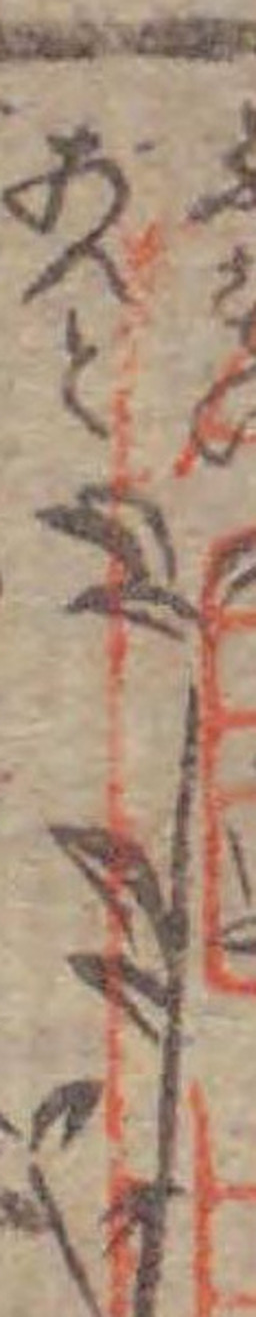あんと
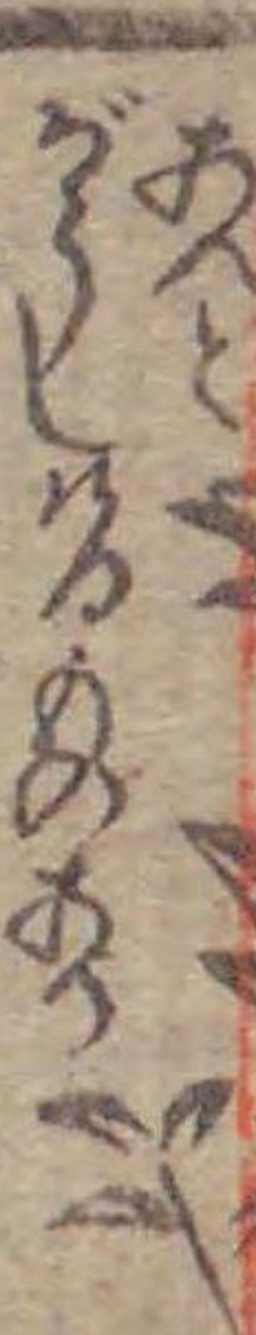がうしけるものあり
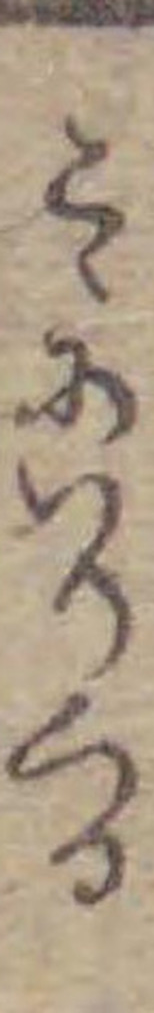こゝにいりくる
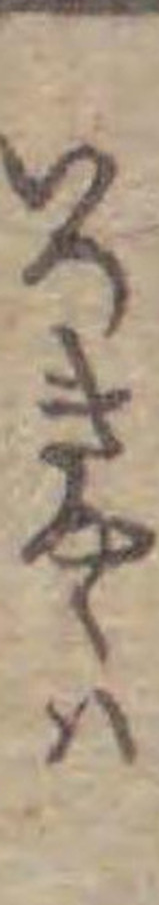いつきやくは
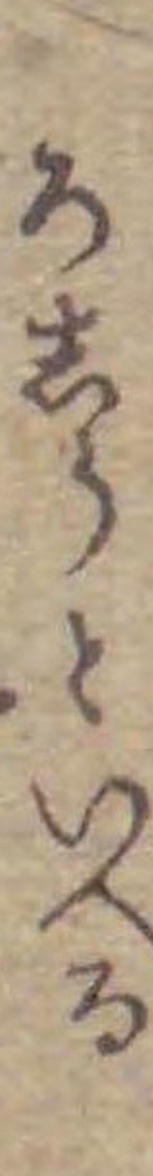ろしうといへる
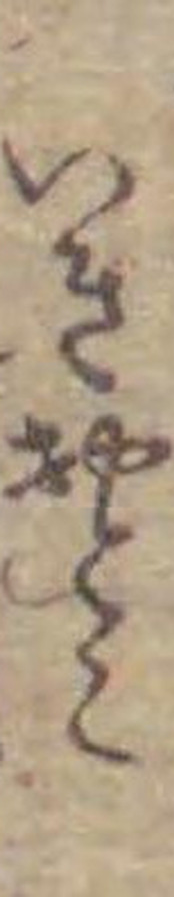いきおとこ
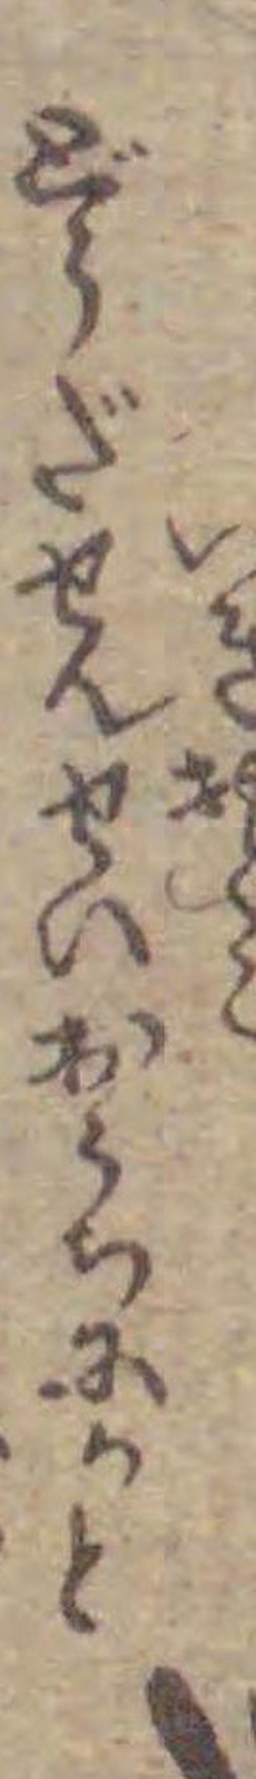どうだせんせいおうちにかと
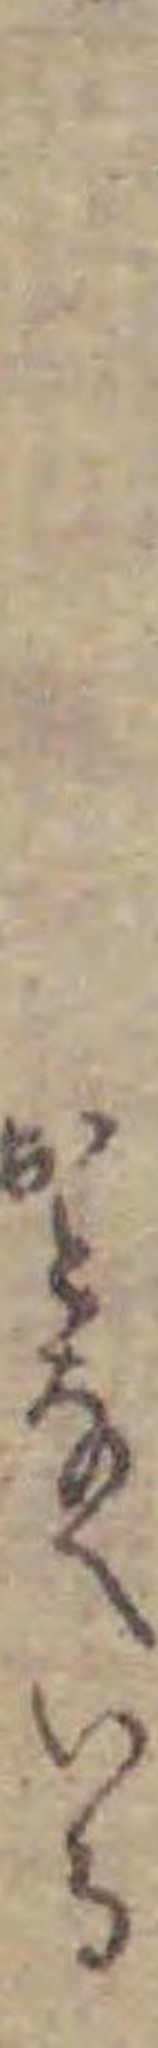おとなへいる
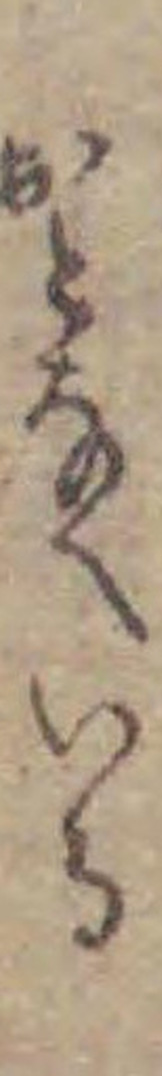おとなへいる

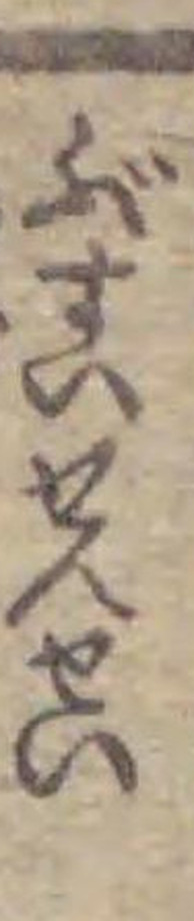ぶすいせんせい
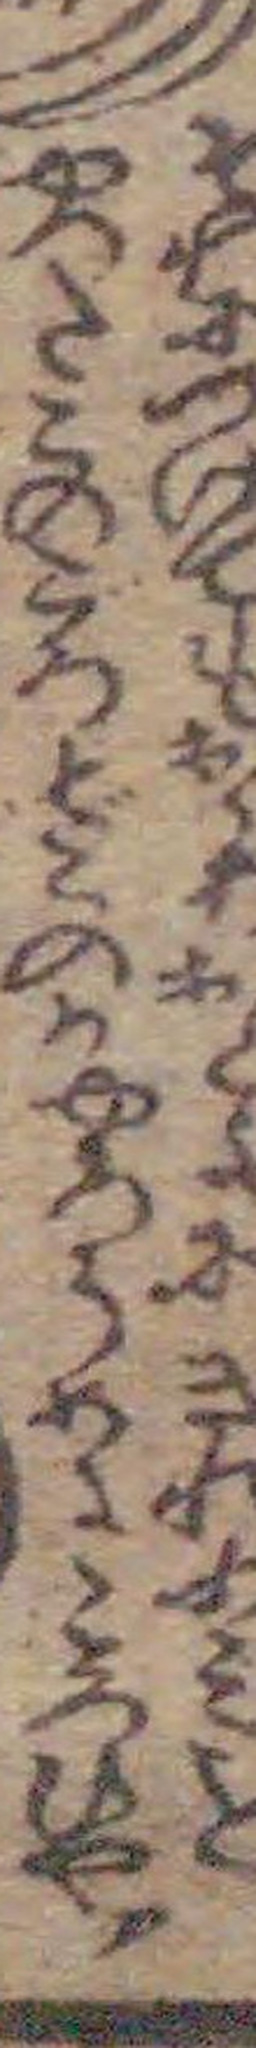やつたこのごろどこのかやろうめにころひやァ
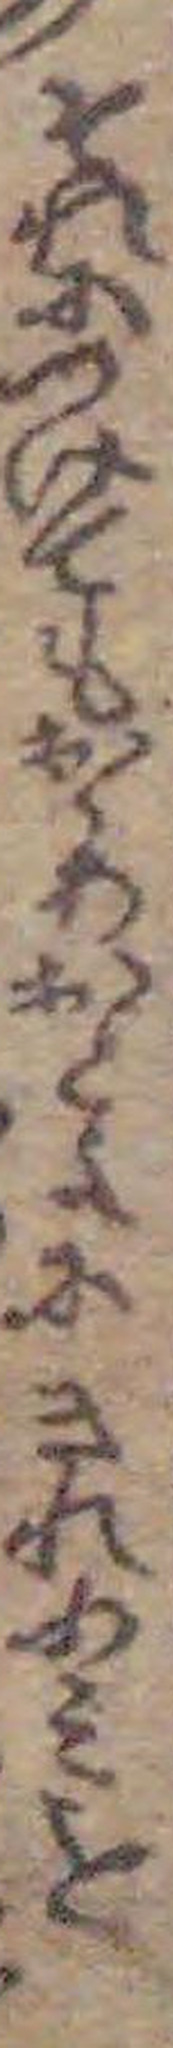それにつけてもおらあおとよにきれふみを
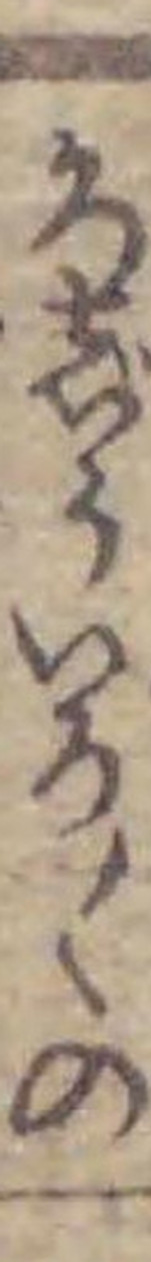ろじういろ〳〵の
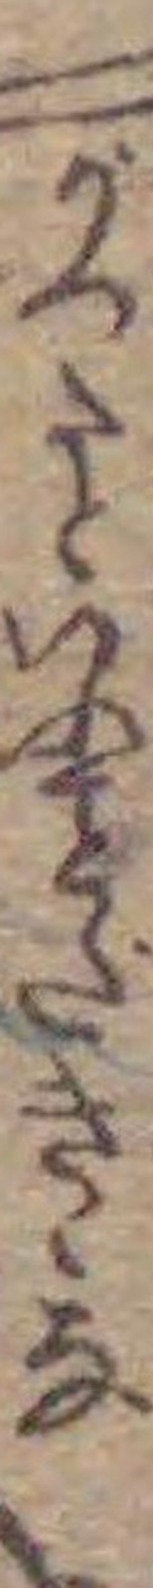がつたといふことだきゝな
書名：芸者呼子鳥 : 2巻（松泉堂）
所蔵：国立国会図書館 National Diet Library, JAPAN
